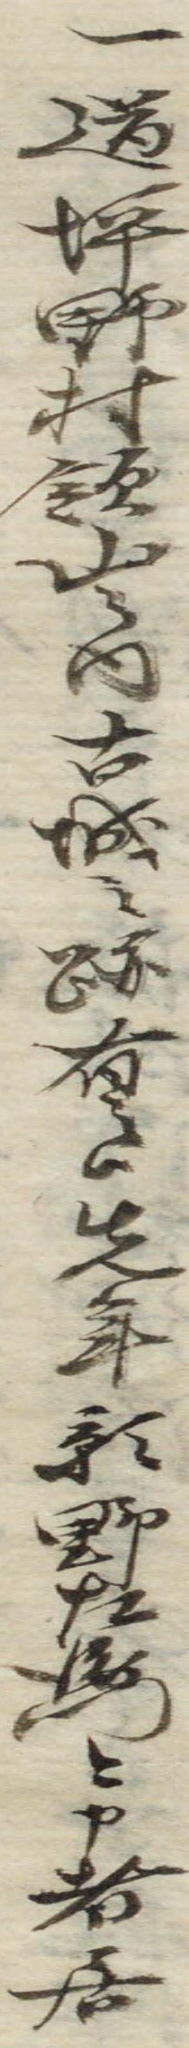一道坪野村領山之内古城之跡有之候先年野左衛門と申者居
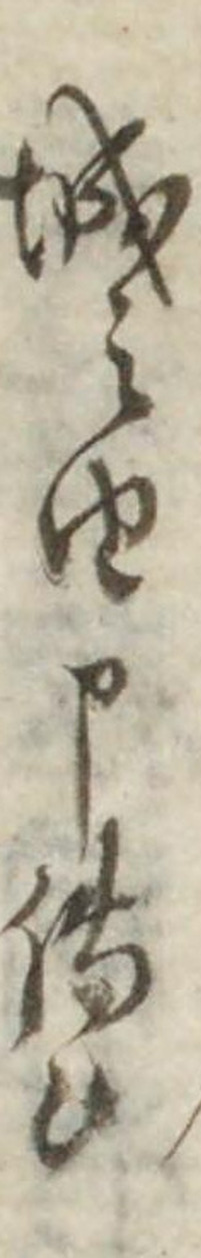城之由申伝候
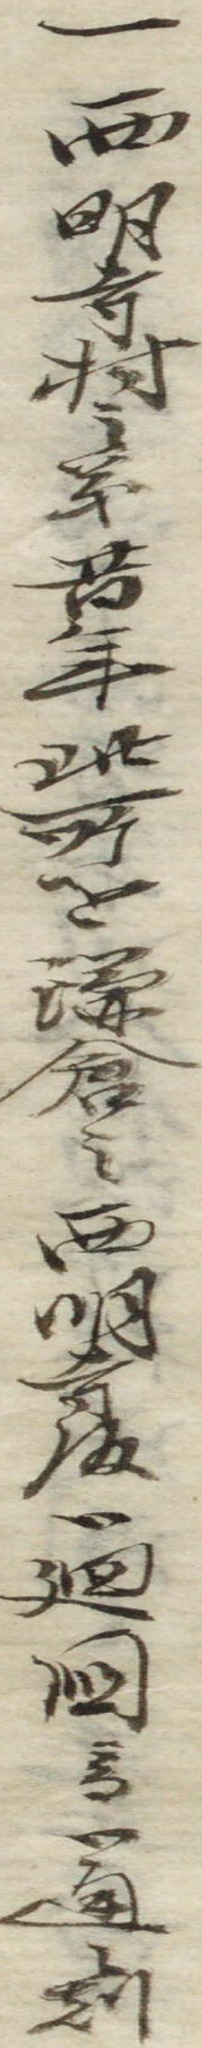一西明寺村之義昔年此所を鎌倉之西明寺殿御廻国に而御通之刻
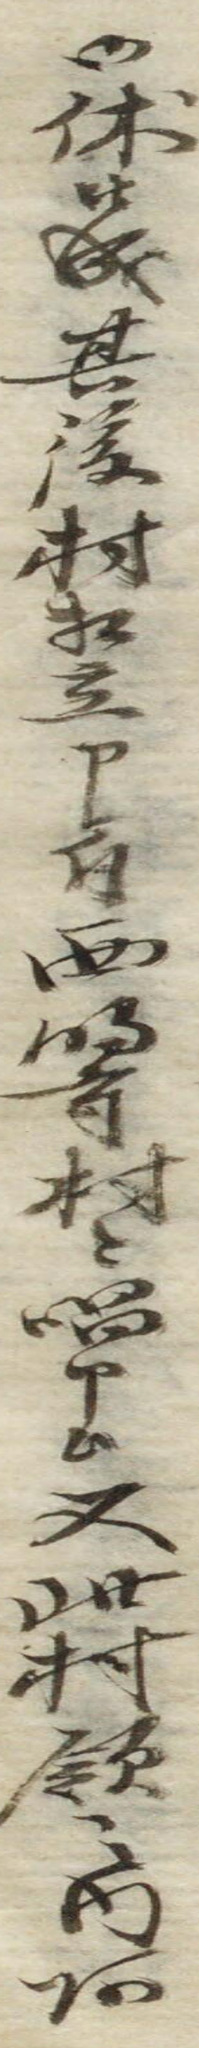御休被成其後村相立申に付西明寺村と唱申候又此村領内之内阿
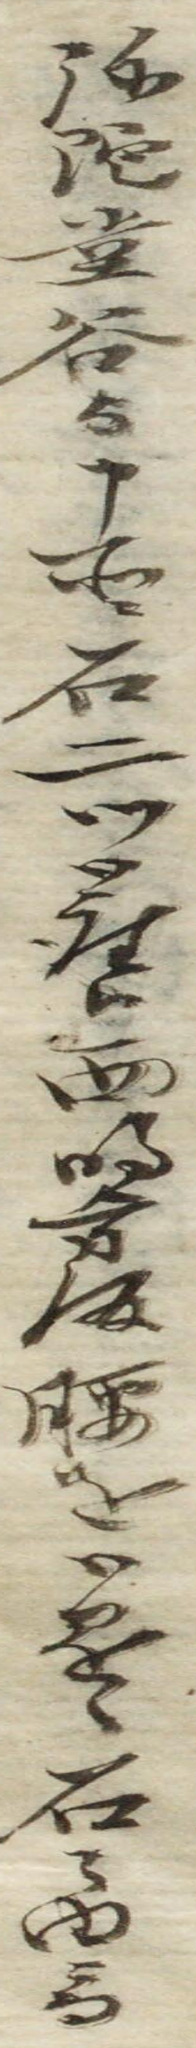弥陀堂谷与申所に石二つ御座候西明寺殿腰を御懸候石之由に而
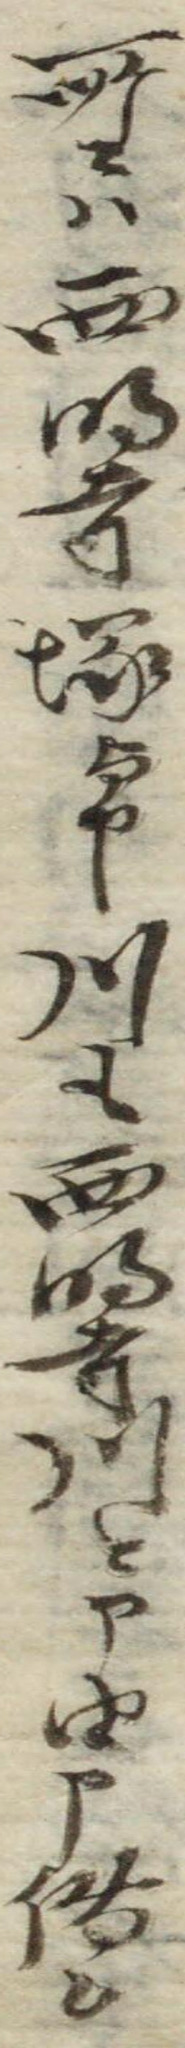所には西明寺塚与申川も西明寺川と申由申伝候

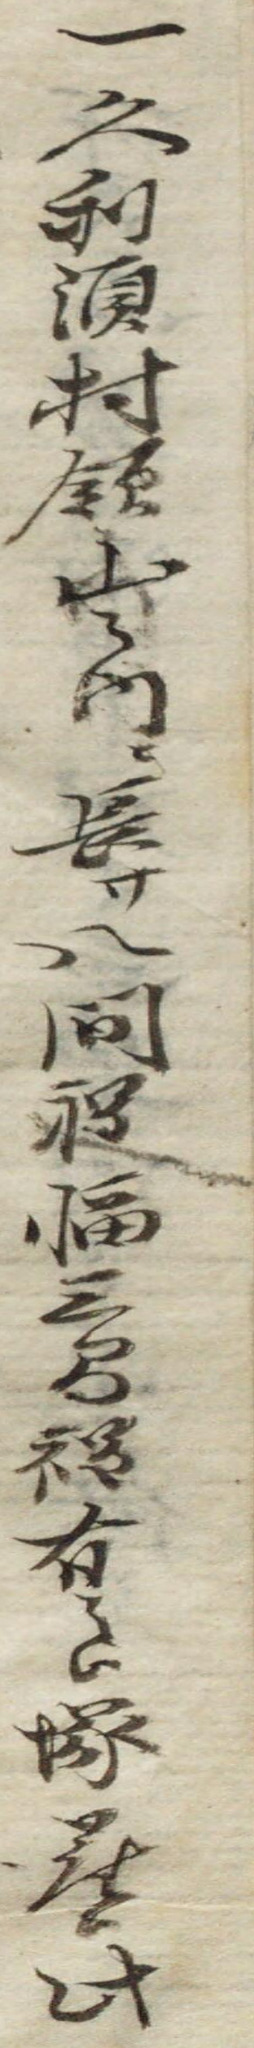一久利須村領山之内に長さ八間程幅三間程有之候塚御座候此
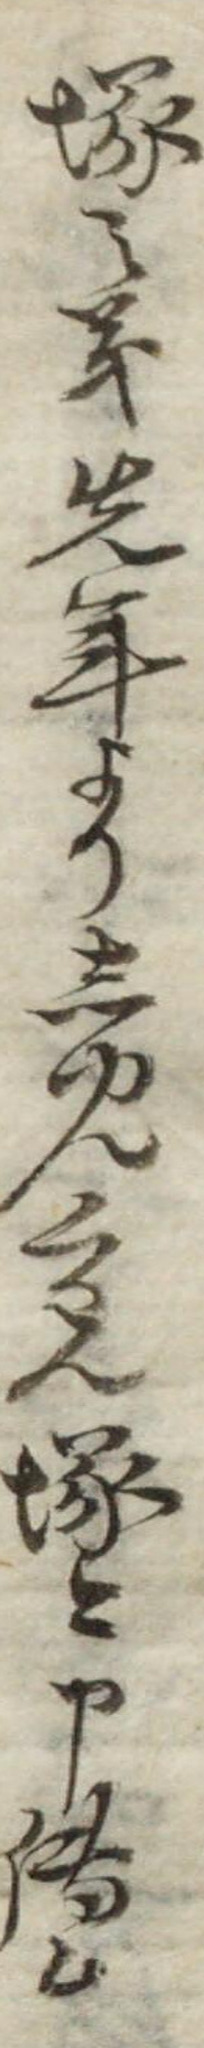塚之義先年よりしゆんくわん塚と申伝候
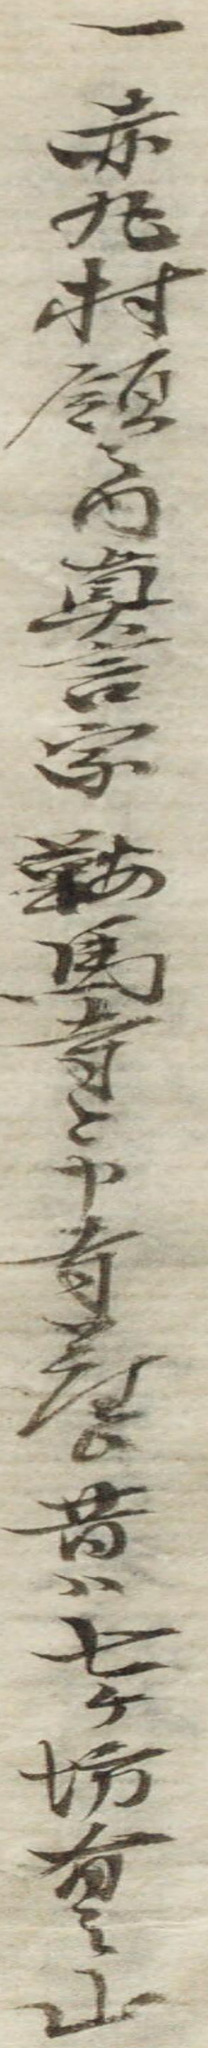一赤丸村領之内真言宗鞍馬寺と申寺御座候昔は七ヶ坊有之山
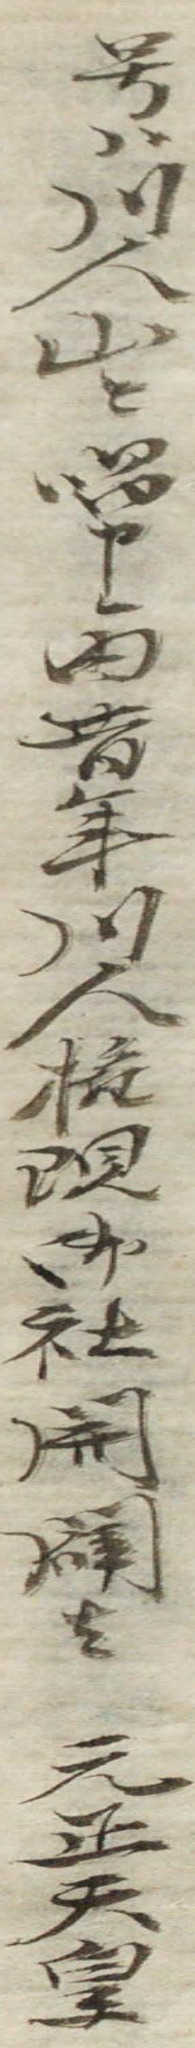号は川人山と唱申候由昔年川人権現御社開闢は元正天皇
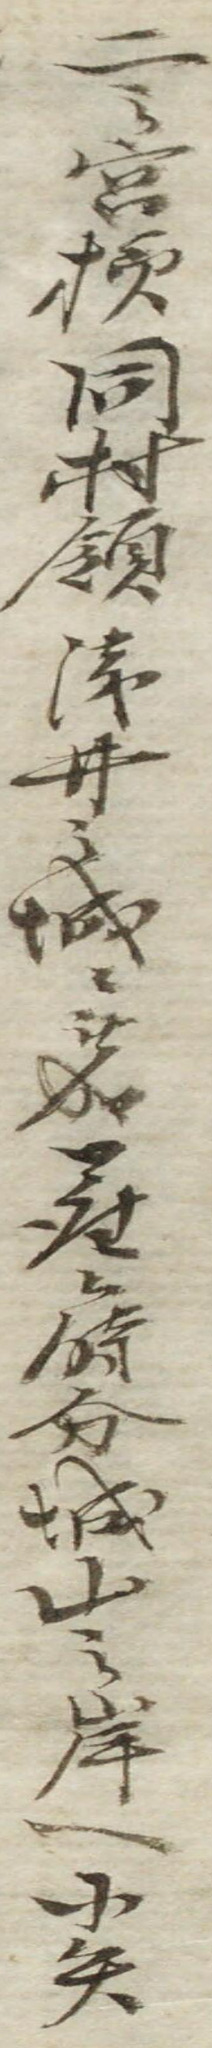二之宮様同村領浅井之城に被成御座候時分城山之岸へ小矢
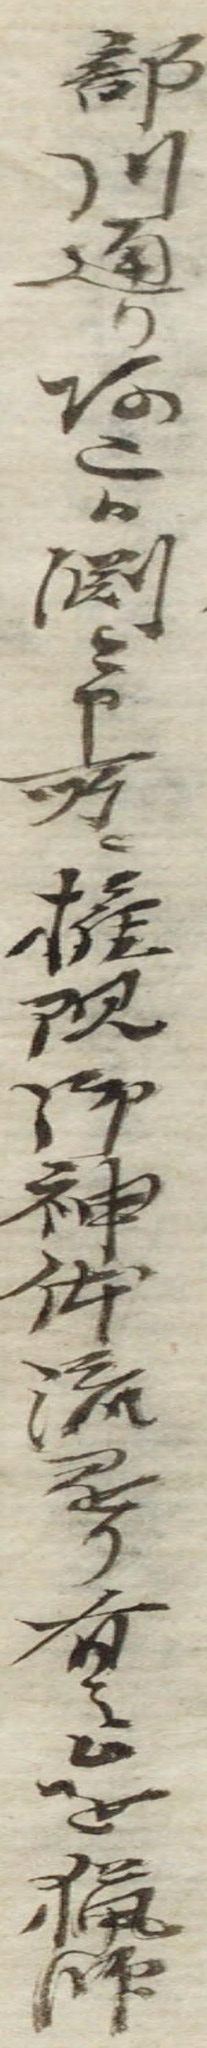部川通りあこか渕と申所に権現御神体流懸り有之候を猟師
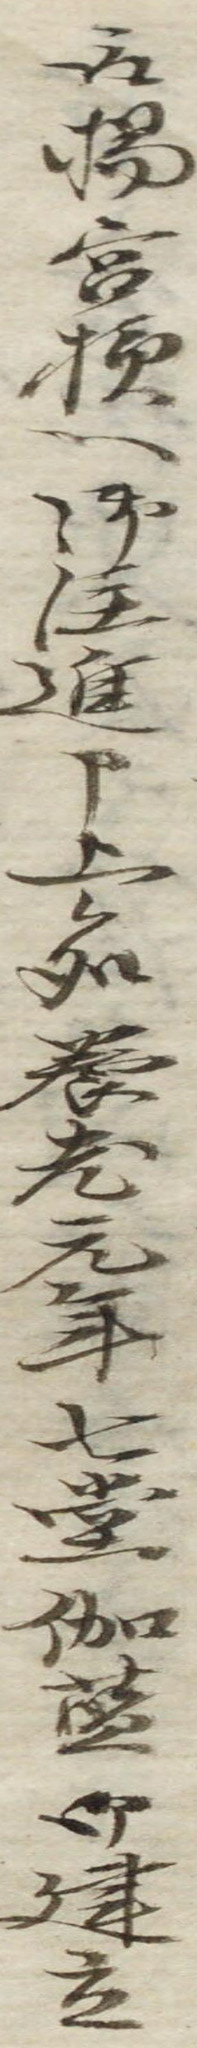取揚宮様へ御注進申上候処養老元年七堂伽藍御建立
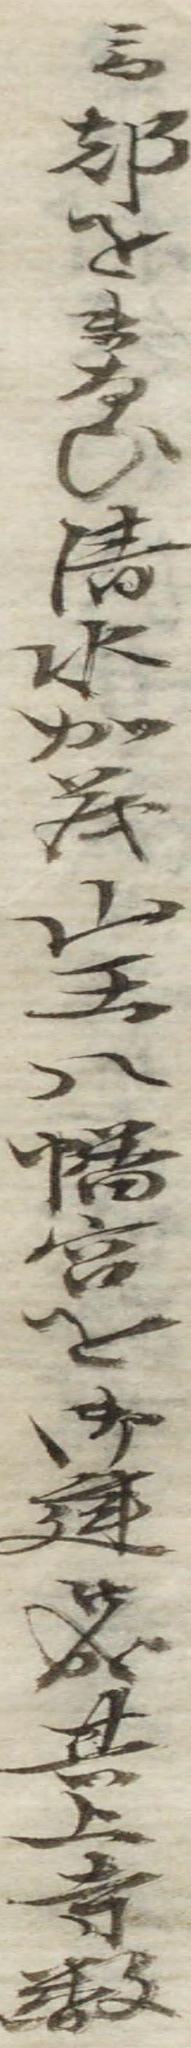に而都をまなひ清水賀茂山王八幡宮を御建立被成其上寺数
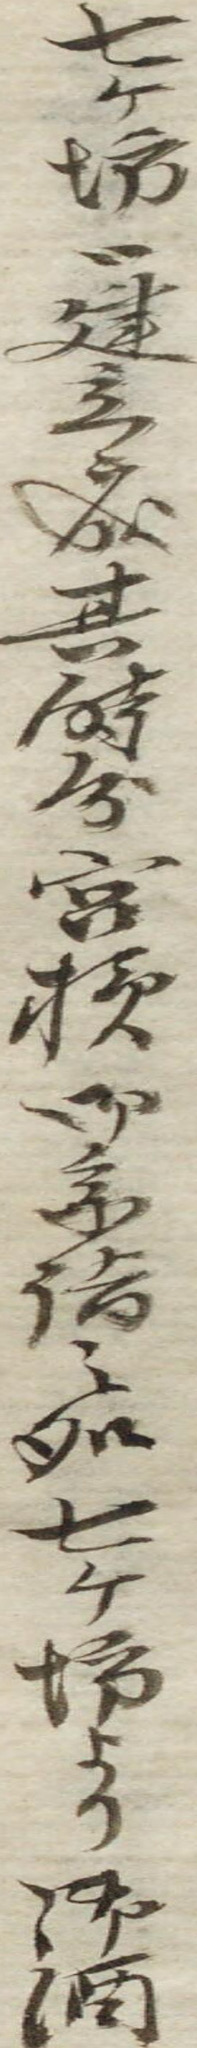七ヶ坊御建立被成其時分宮様御参詣之処七ヶ坊より御酒
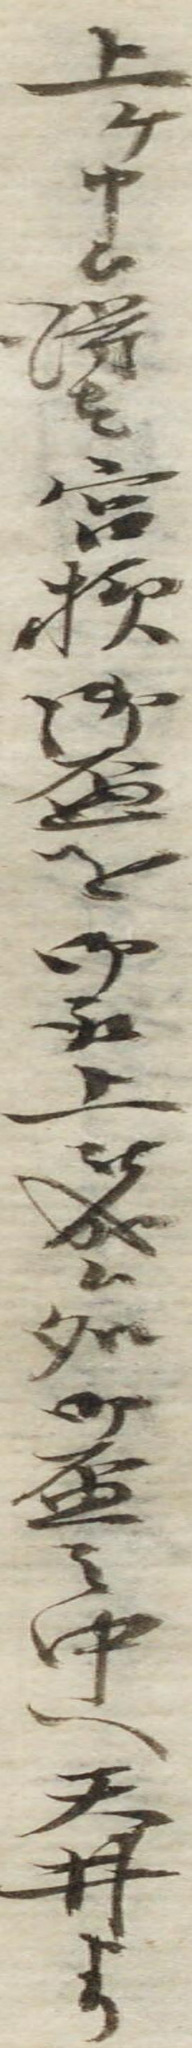上ヶ申候得は宮様御盃を御取上被成候処御盃之中へ天井
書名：加越能旧聞録
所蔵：Ishikawa Prefectural Library
